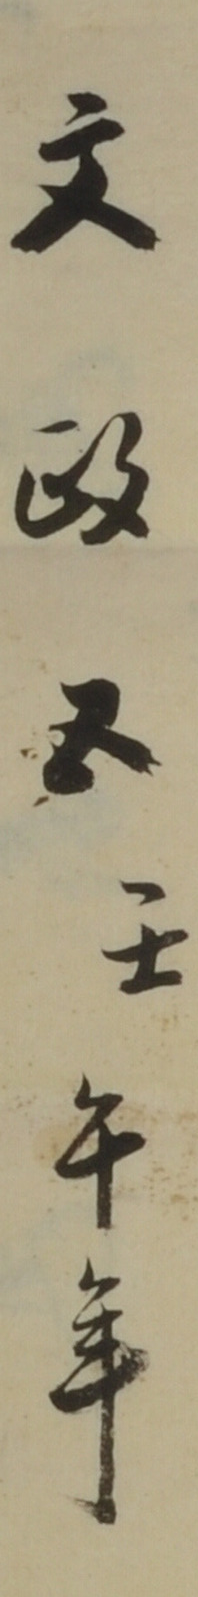文政五壬午年

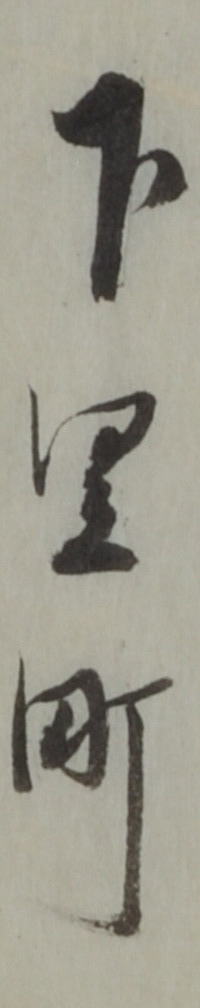下里町
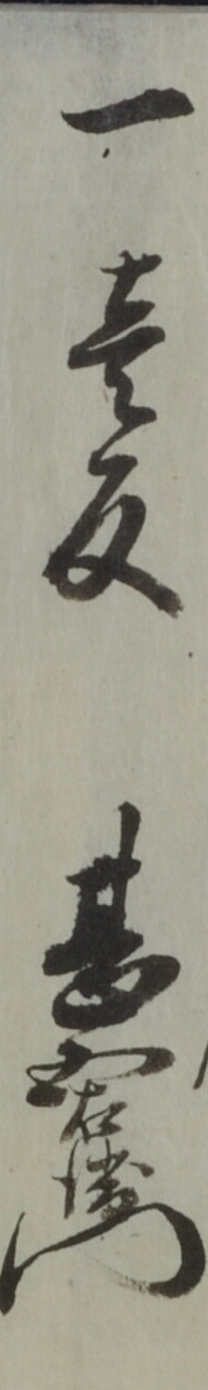一壱反甚五右衛門
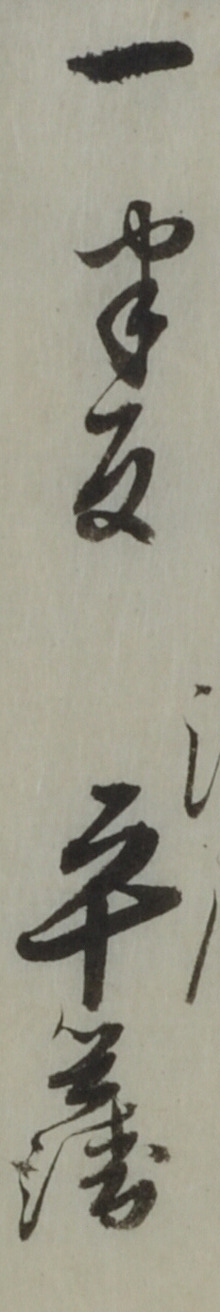一半反平兵衛
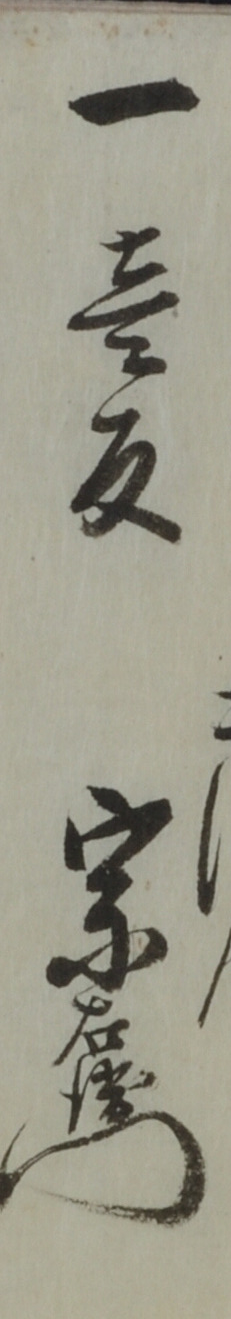一壱反宗右衛門
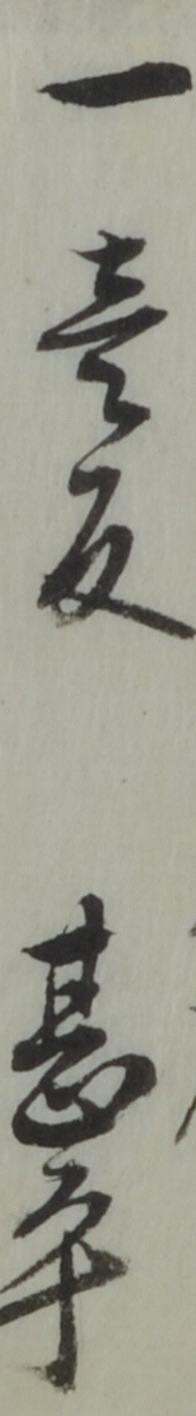一壱反甚平

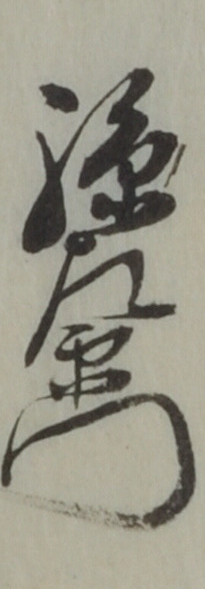孫左衛門
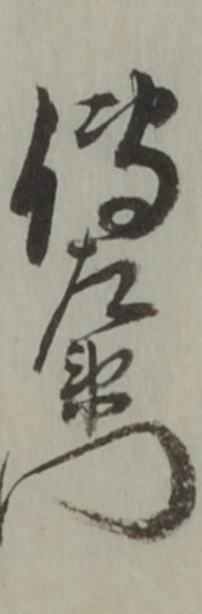伝左衛門
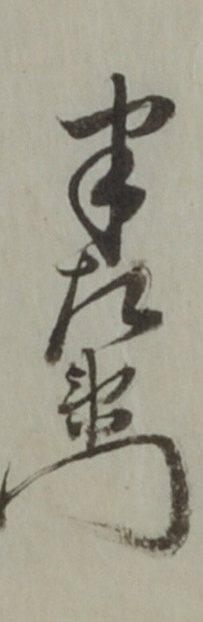孫左衛門
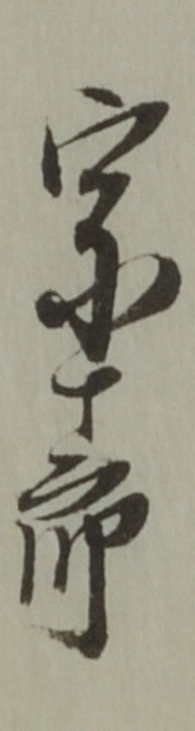宗十郎
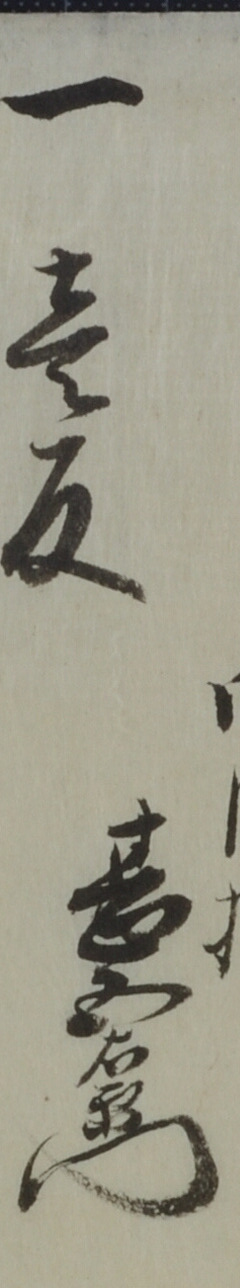一壱反甚五右衛門
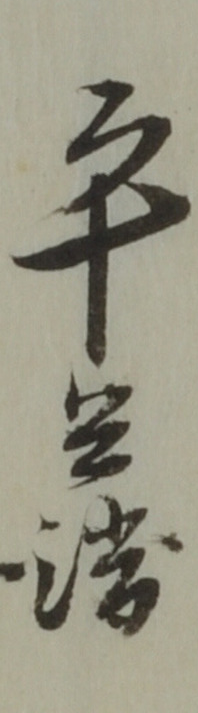平兵衛
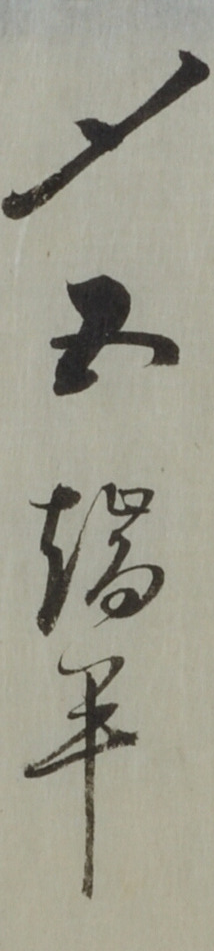〆五端半
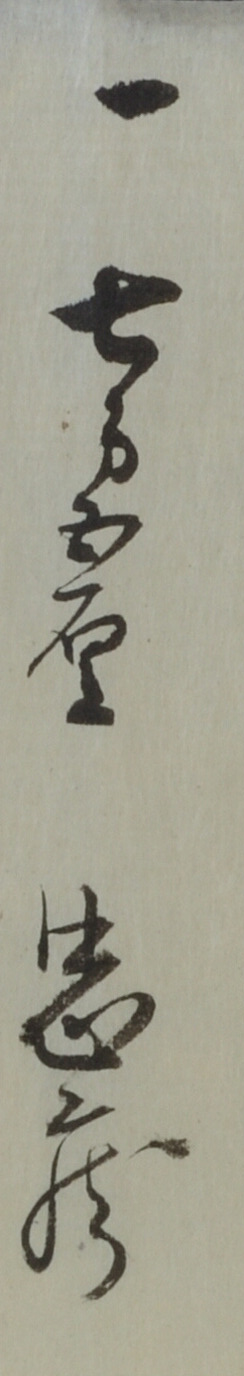七分五厘中蔵

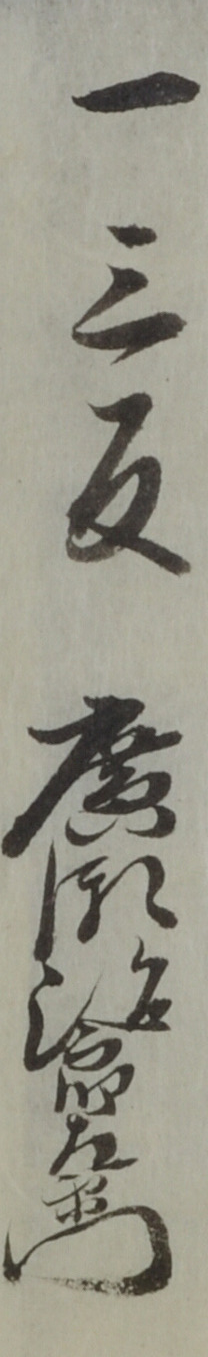一三反広瀬治郎左衛門
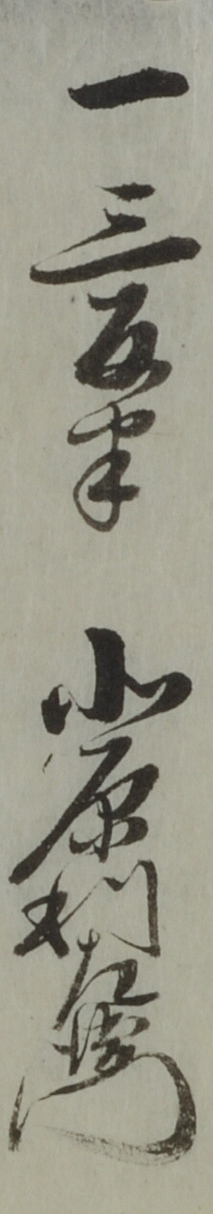一三反半北原利左衛門
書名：融通割合帳
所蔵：伊那市立高遠町図書館・合同会社AMANE
